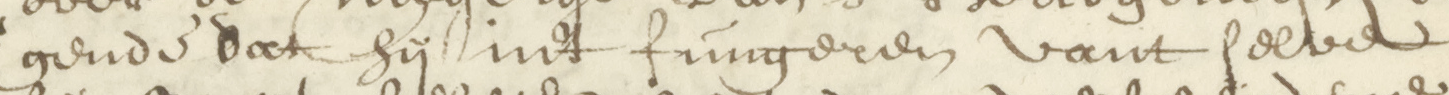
gende dat hij int fungeren vant selve
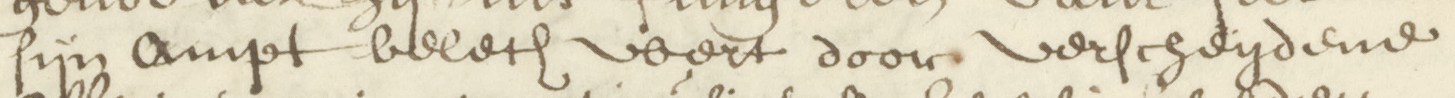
sijn Ampt beleth wert door verscheijdene
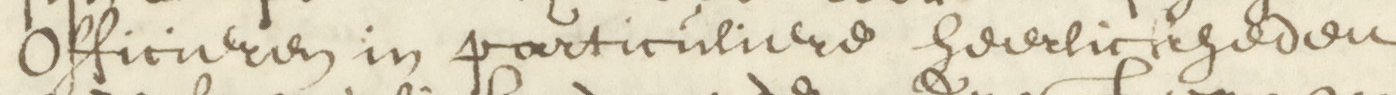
Officieren in particuliere heerlickheden
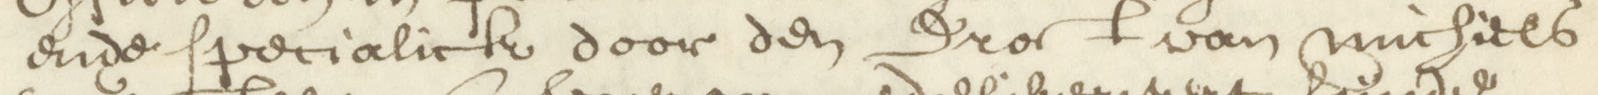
ende specialick door den Drost van Michiels
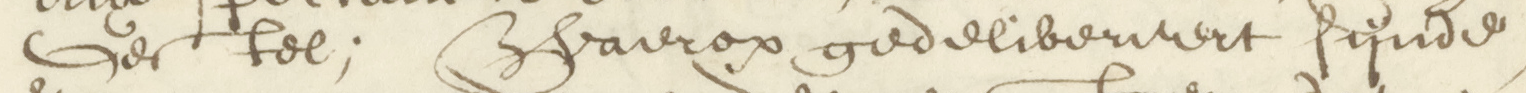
Gestel; Waerop gedelibereert sijnde,
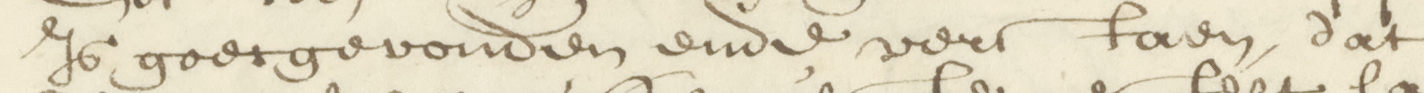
Is goetgevonden ende verstaen, dat
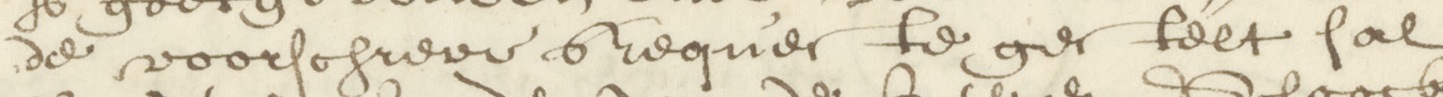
de voorschreve Requeste gestelt sal
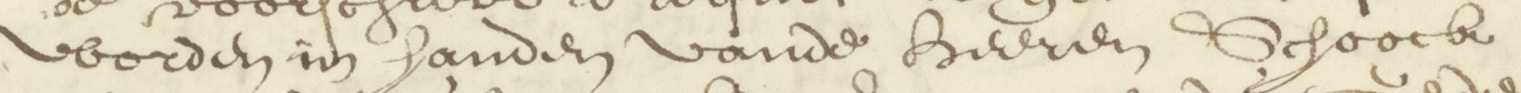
worden in handen vande Heeren Schoock
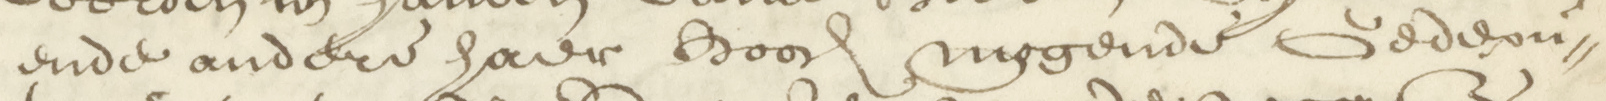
ende andere haer Hooch Mogende Gedepu„
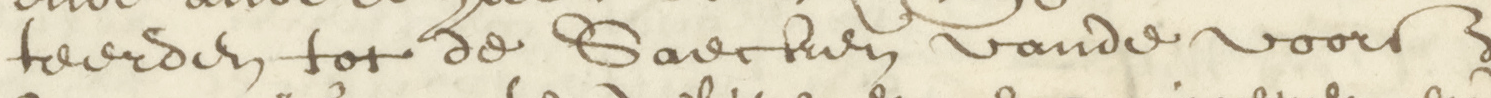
teerden tot de Saecken vande voors.
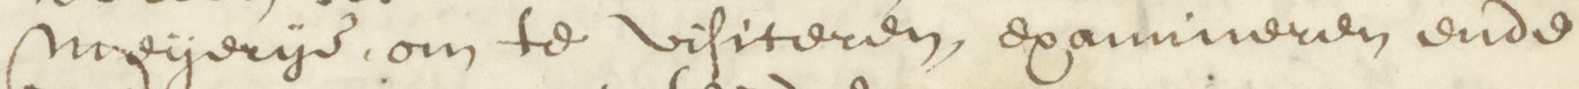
meijerije, om te visiteren, examineren ende
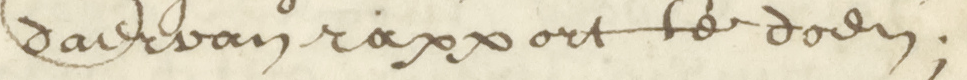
daervan rapport te doen.
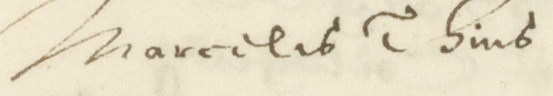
Marcelis Thins
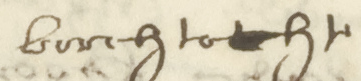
borchtocht
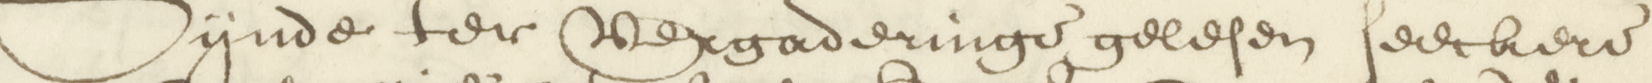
Sijnde ter Vergaderinge gelesen seeckere
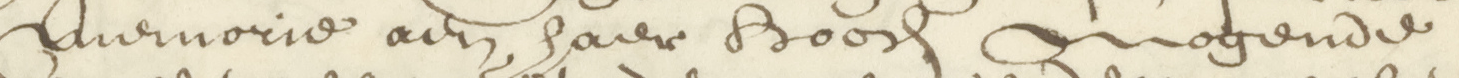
memorie aen haer Hooch Mogende
